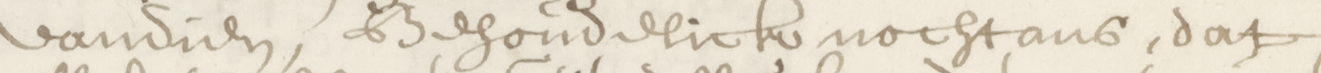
vandien, Behoudelick nochtans, dat
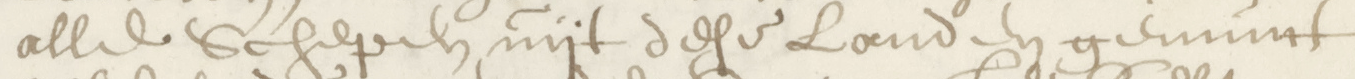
alle Schepen uijt dese Landen gemunt
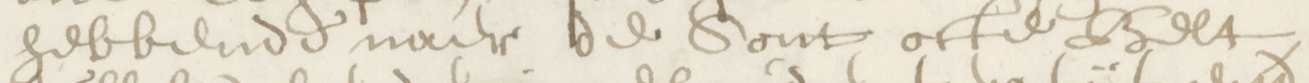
hebbende naer de Sont ofte Belt,
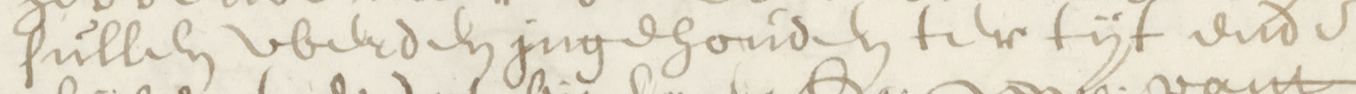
sullen werden ingehouden ter tijt ende
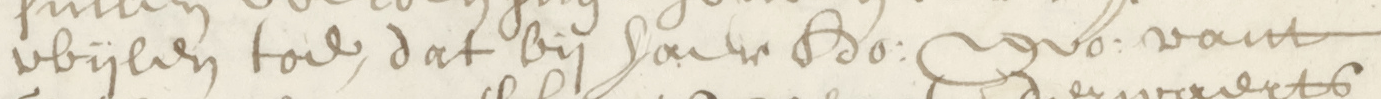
wijlen toe, dat bij haer Ho:Mo: vant
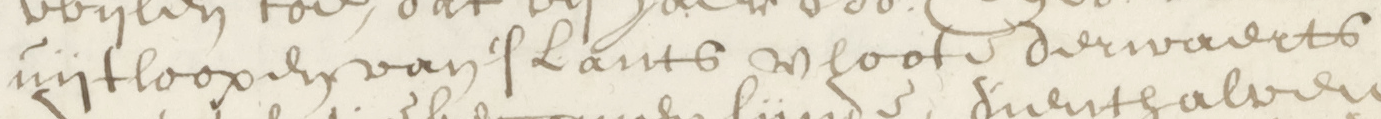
uijtloopen van 's Lants vloote derwaerts
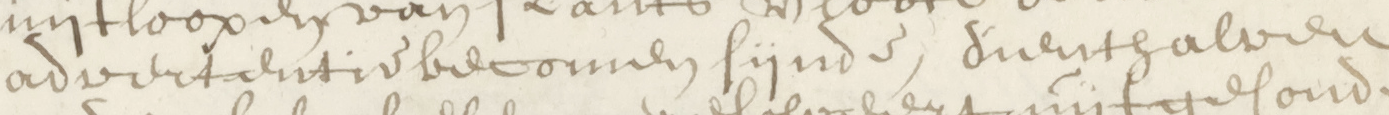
advertentie becomen sijnde, dienthalven
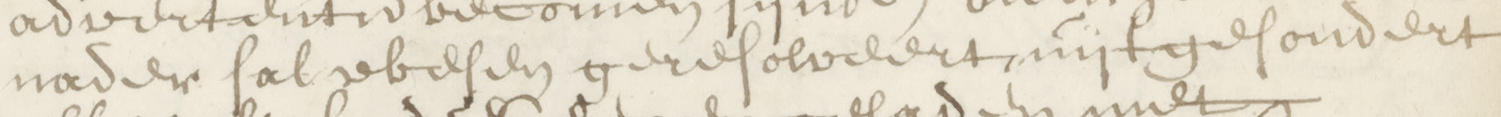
nader sal wesen geresolveert, uijtgesondert
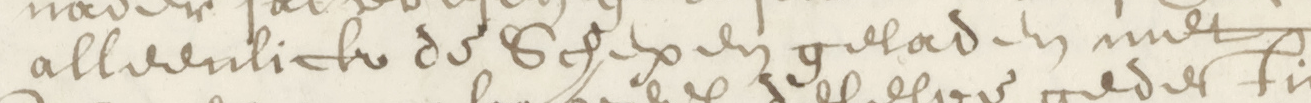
alleenlick de Schepen geladen met
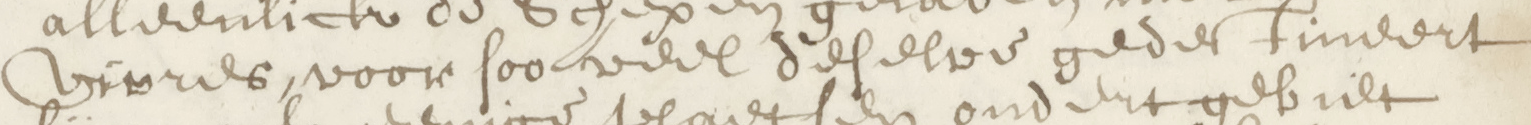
vivres, voor soo veel deselve gedestineert
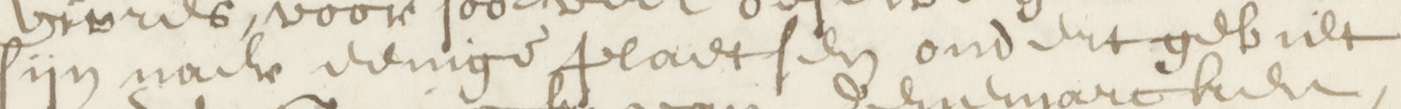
sijn naer eenige plaetsen ondert gebiet
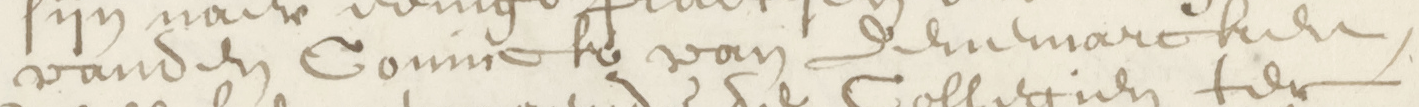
vanden Coninck van Denemarcken,
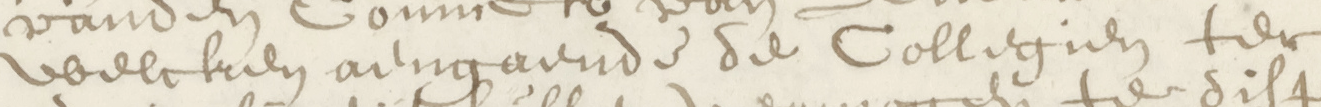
welcken aengaende de Collegien ter
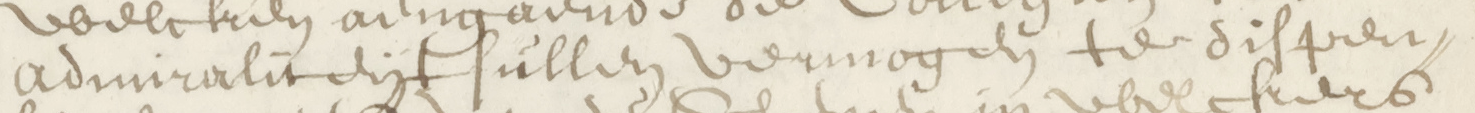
Admiraliteijt sullen vermogen te dispen„
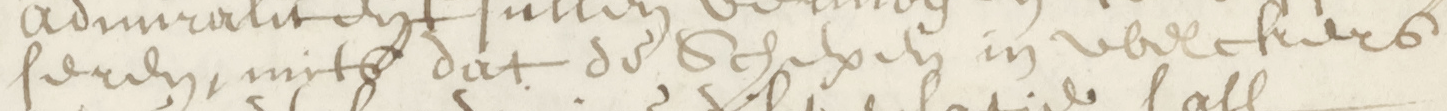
seren, mits dat de Schepen in welckers
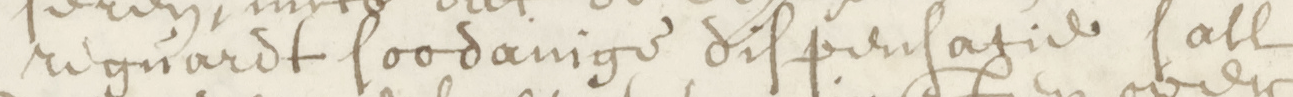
reguardt soodanige dispensatie sall
